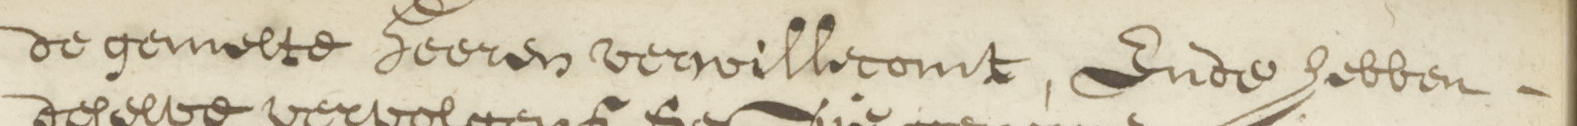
de gemelte heeren verwillecomt. Ende hebben ¬
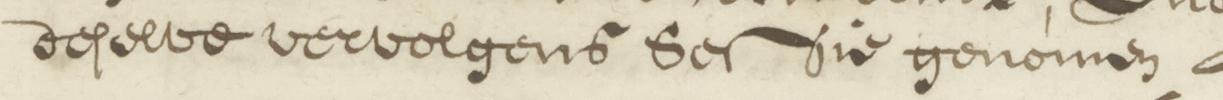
deselve vervolgens sessie genomen.
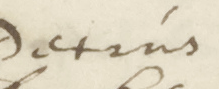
Petrus
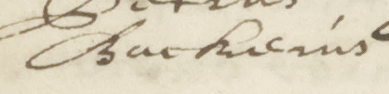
Backerus
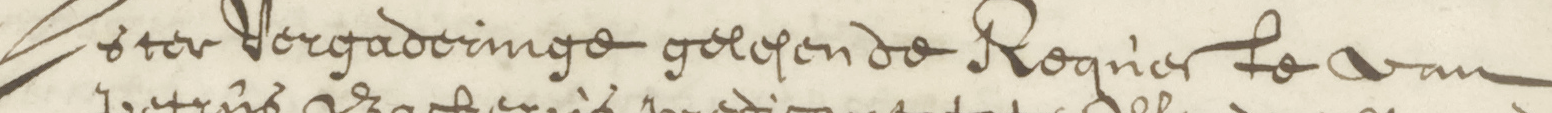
Is ter Vergaderinge gelesen de Requeste van
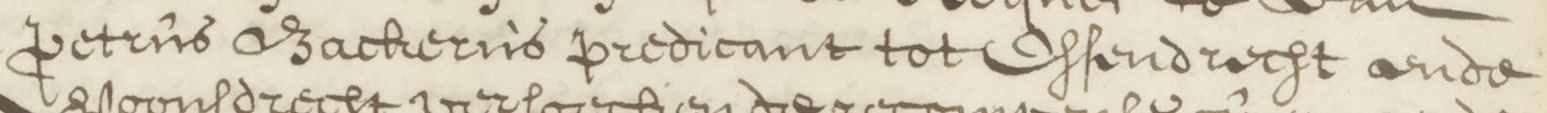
Petrus Backerus predicant tot Ossendrecht ende
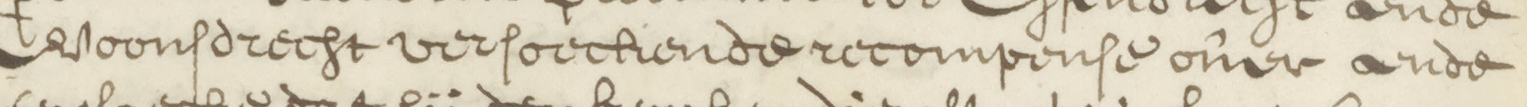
Woonsdrecht versoeckende recompense ouer ende
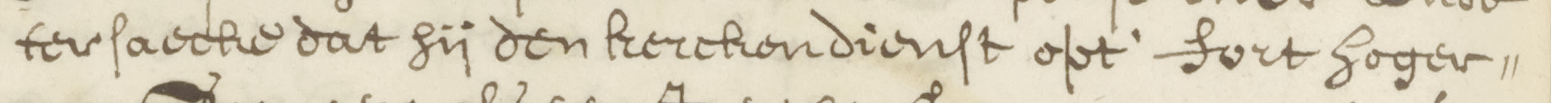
ter saecke dat hij den kerckendienst opt' fort hoger„
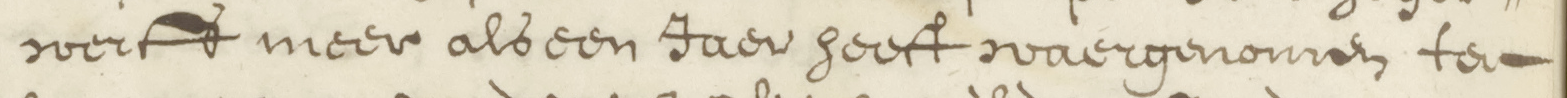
werff meer als een Jaer heeft waergenomen ter
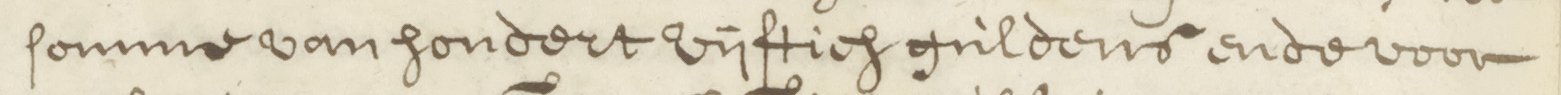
somme van hondert vijftich guldens ende voor
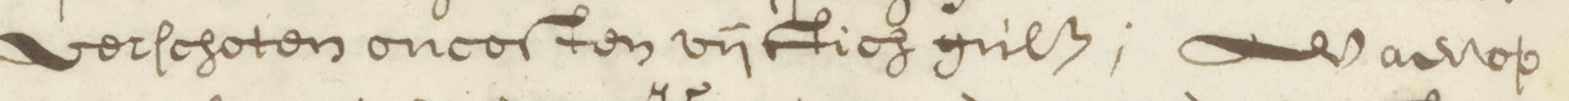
verschoten oncosten vijftich gul.; Waerop
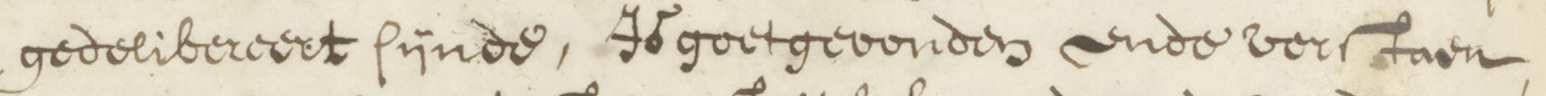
gedelibereert sijnde, Is goetgevonden ende verstaen,
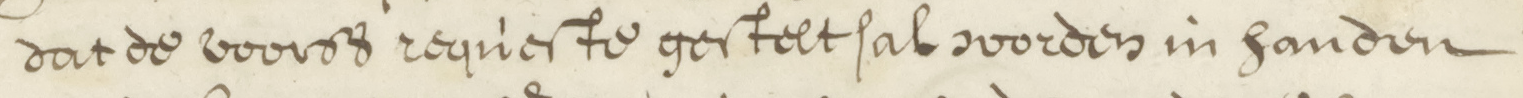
dat de voors requeste gestelt sal worden in handen
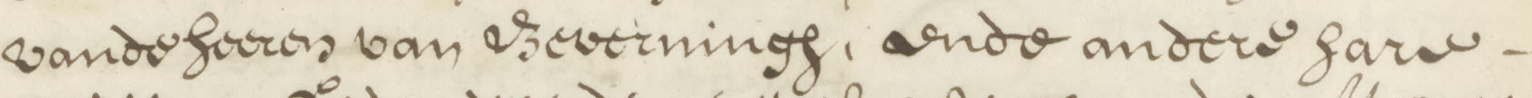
vande heeren van Beverningh, ende andere hare
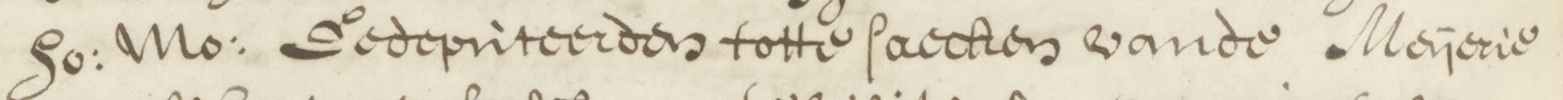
ho:Mo: Gedeputeerden totte saecken vande Meijerie
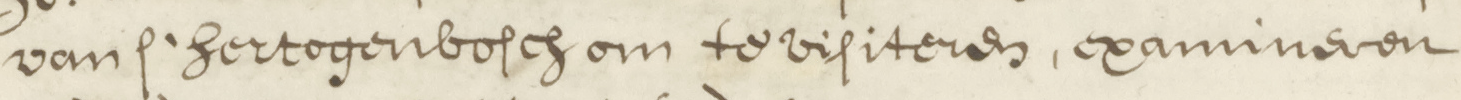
van s'hertogenbosch om te visiteren, examineren,
